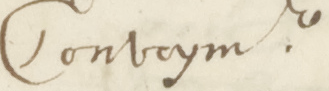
Convoymr.
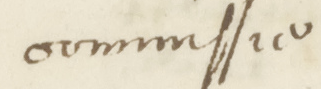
commissie
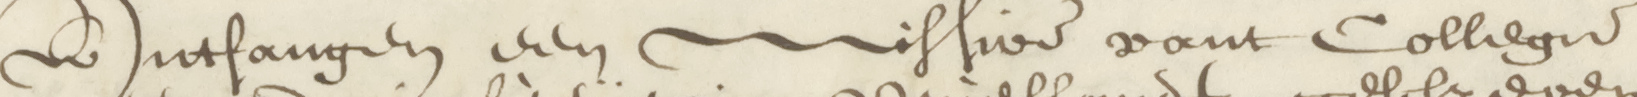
Ontfangen een missive vant Collegie
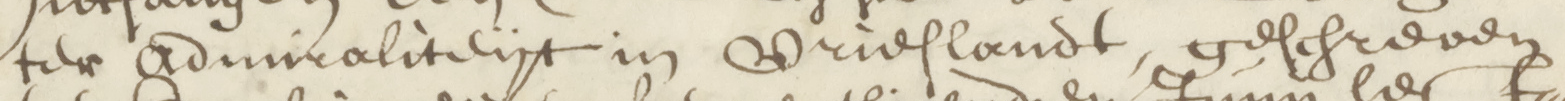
ter Admiraliteijt in Vrieslandt, geschreven
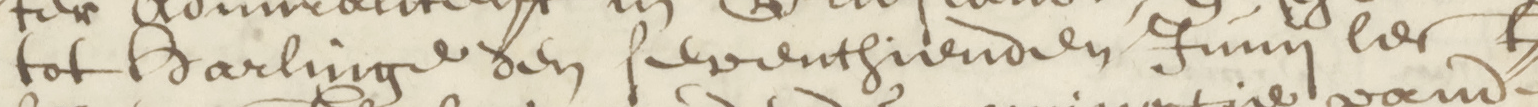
tot Harlinge den seventhienden Junij lest„
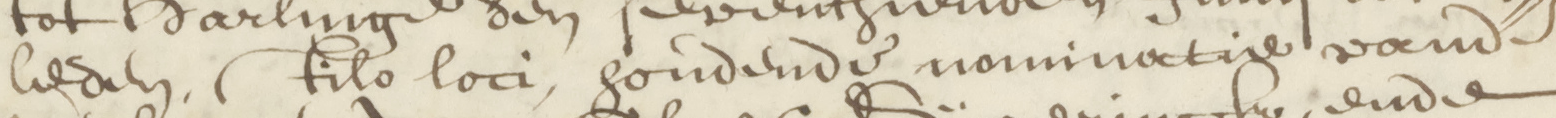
leden, stilo loci, houdende nominatie vande
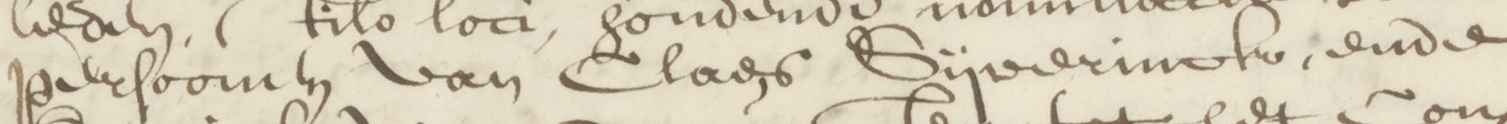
persoonen van Claes Sijverinck, ende
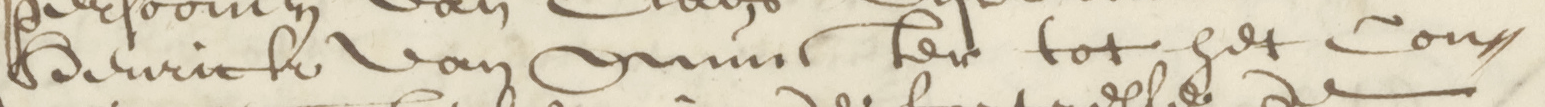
Henrick van Munster tot het Con„
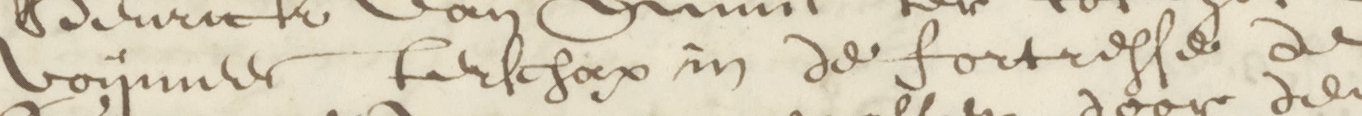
voijmeesterschap in de fortresse de
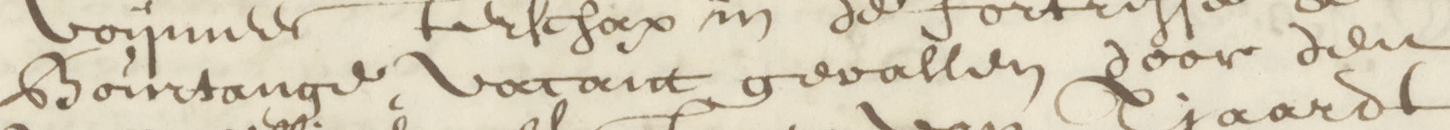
Bourtange, vacant gevallen door den
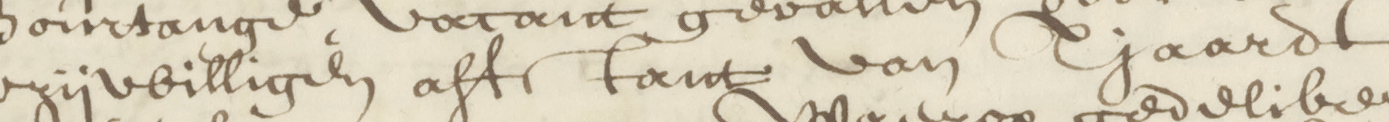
vrijwilligen affstant van Tjaardt
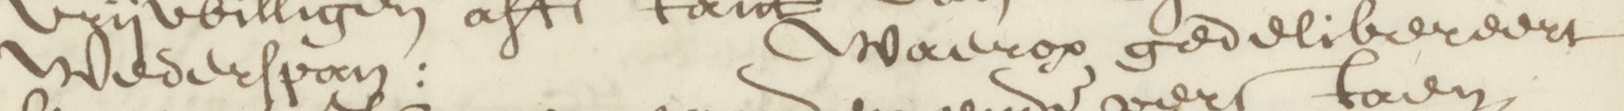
Wederspan: Waerop gedelibereert
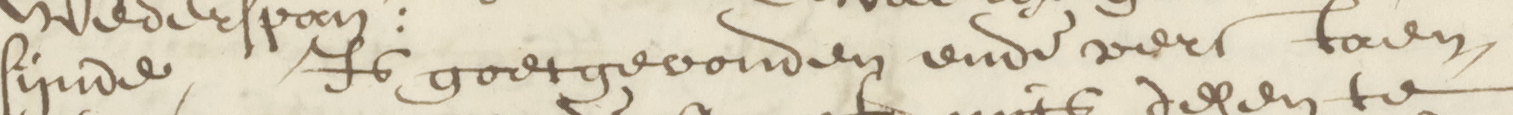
sijnde, Is goetgevonden ende verstaen,
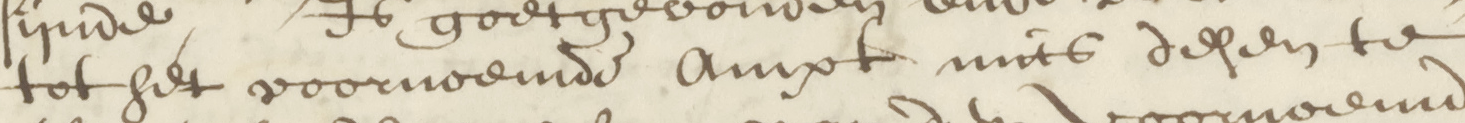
tot het voornoemde Ampt mits desen te
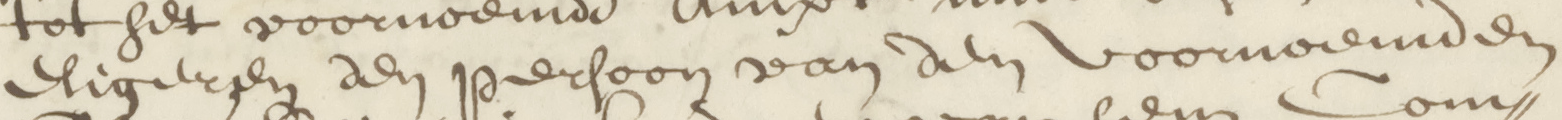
Eligeren den persoon van den voornoemden
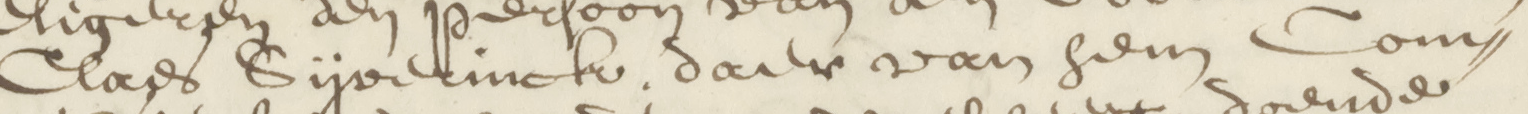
Claes Sijverinck. daer van hem Com„
